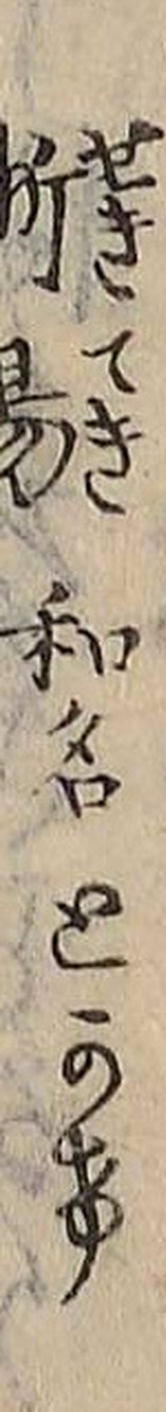蜥蜴和名とかけ
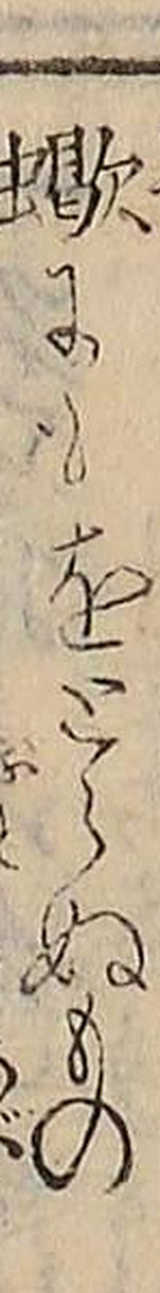蠍にもをとらぬもの
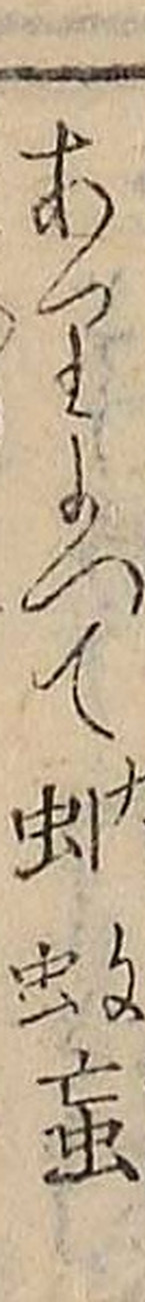ありよつて蚋蚊虻
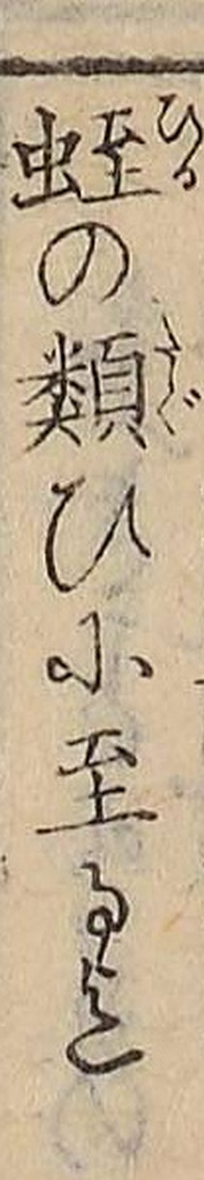蛭の類ひに至る迄
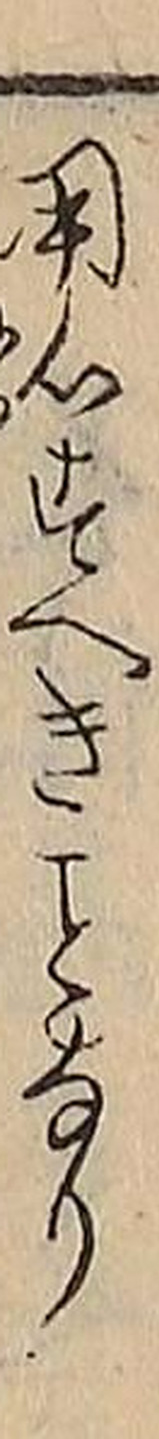用心すへきことなり
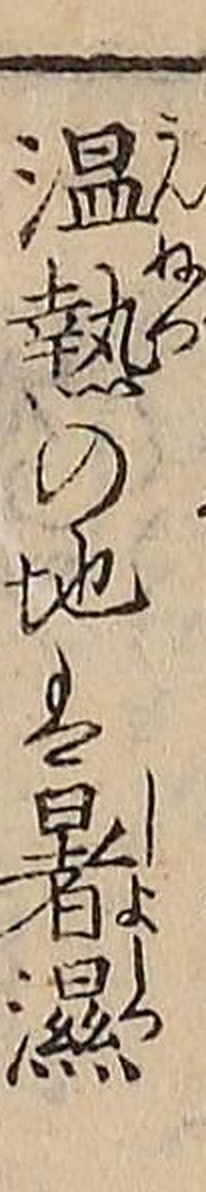温熱の地は暑湿
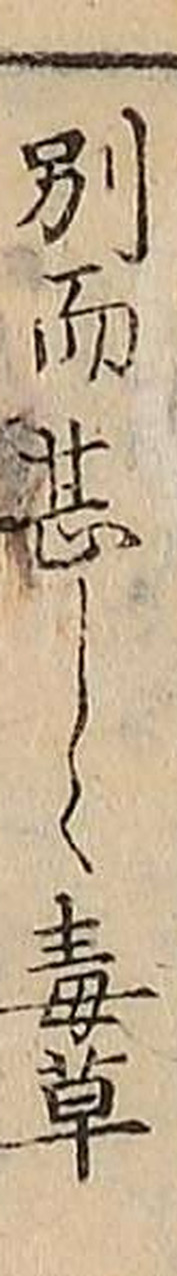別而甚しく毒草
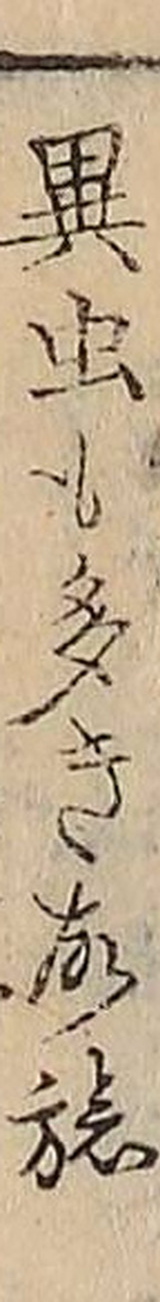異虫も多き故旅
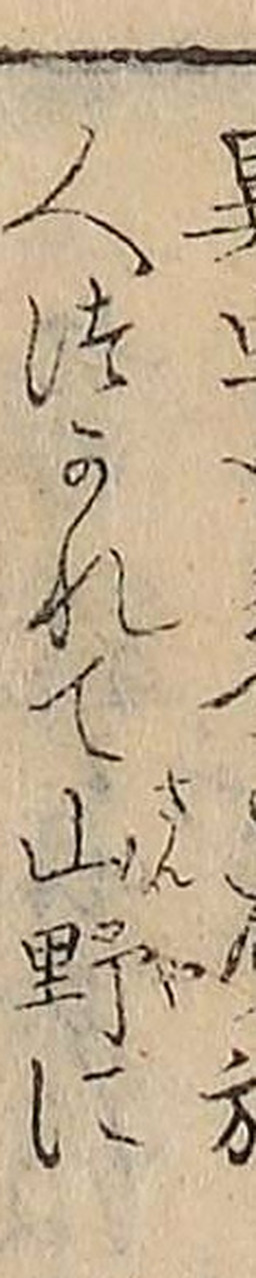人つかれて山野に
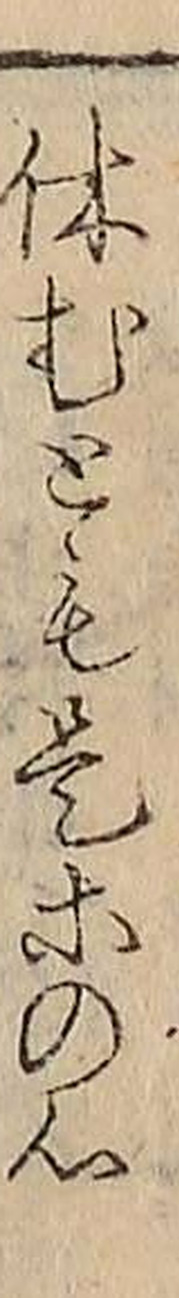休むとも是等の心
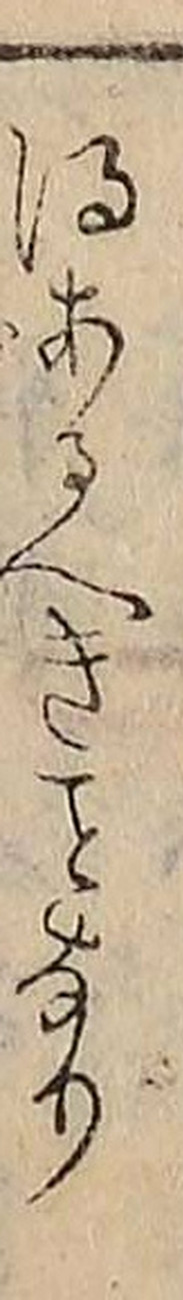得あるへきことなり
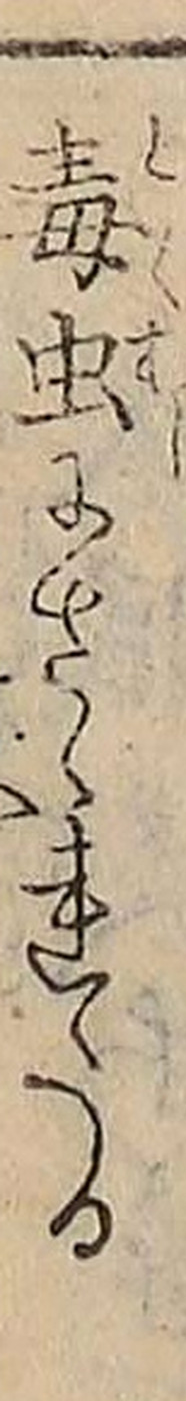毒虫にさゝれたる
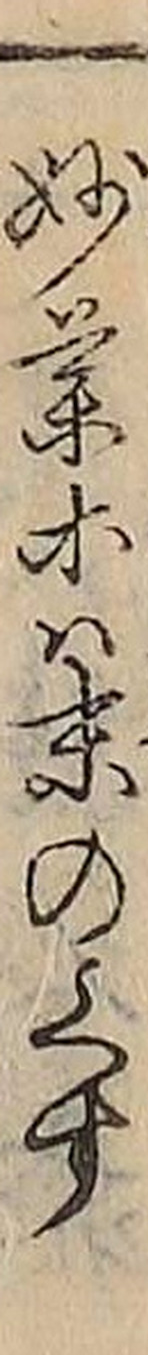妙薬等は末のくす
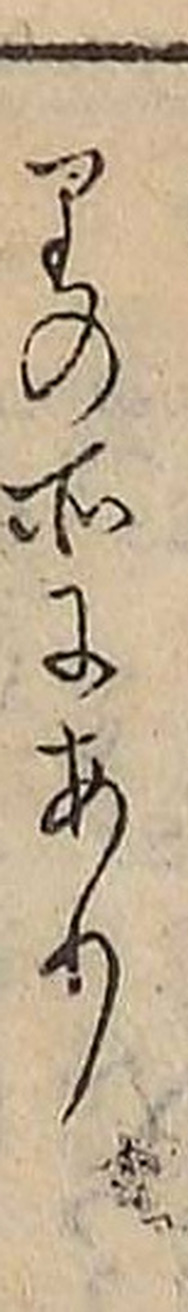りの所にあり
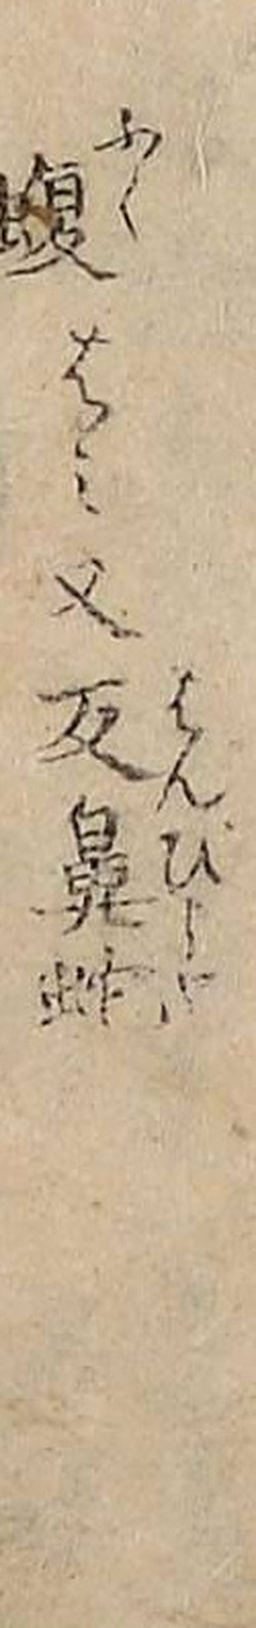蝮はみ又反鼻蛇
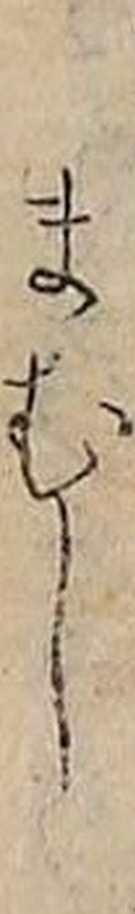まむし
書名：旅行用心集
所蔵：神戸大学附属図書館 国文学研究資料館
